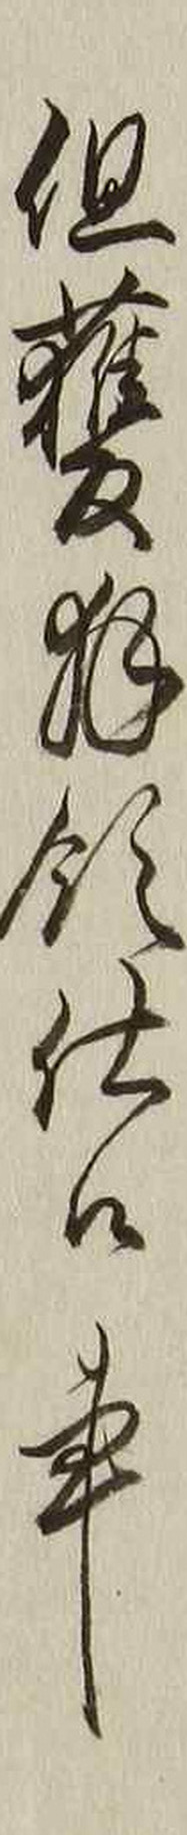但獲拝領仕候事
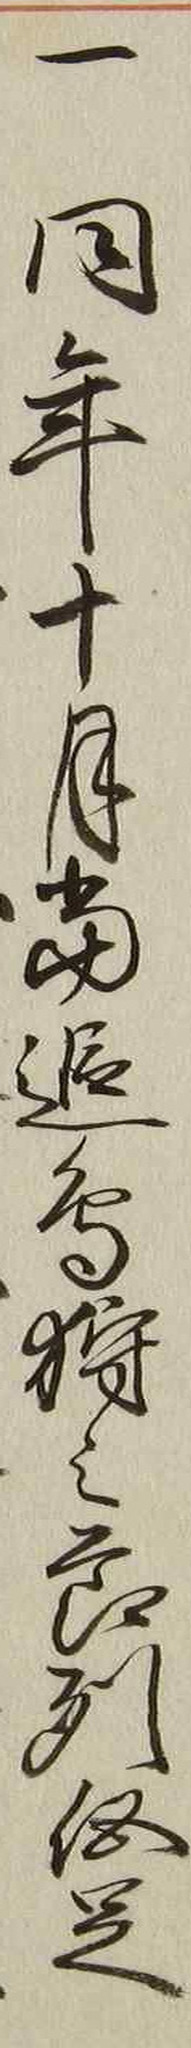一同年十月当追鳥狩之節列伍足
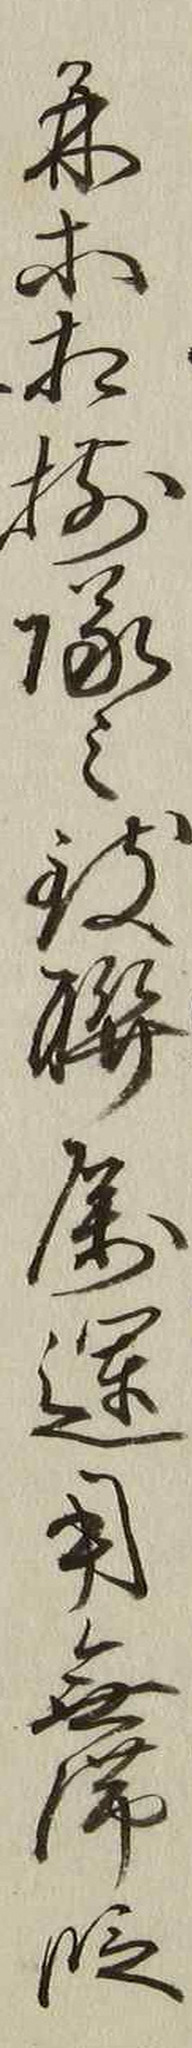并等相揃隊之致聯属運用無滞段
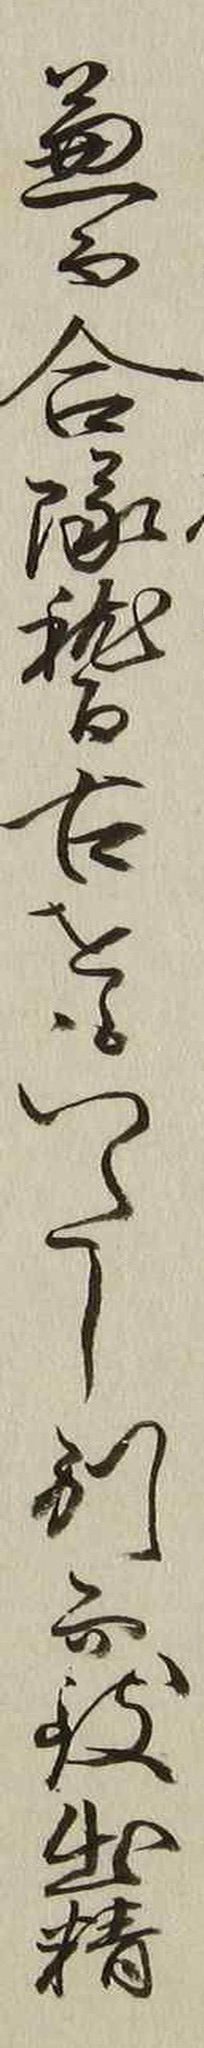兼而合隊稽古をもいたし別而致出精
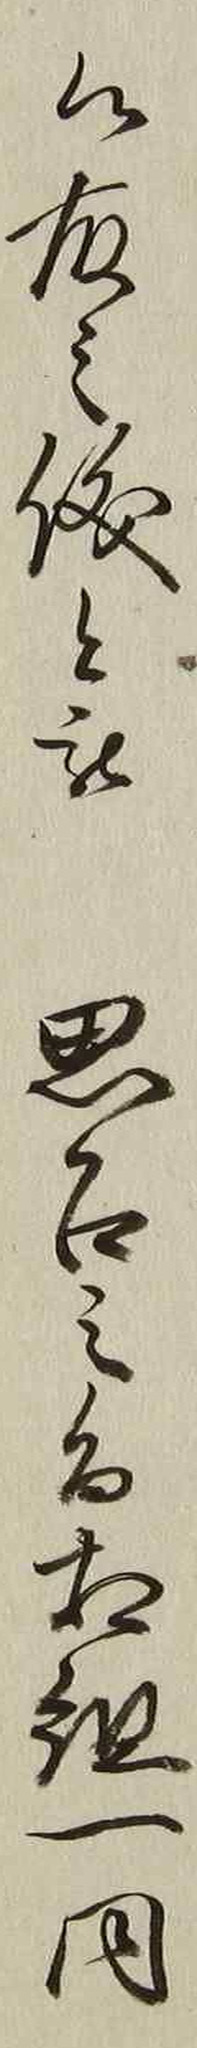候故之儀と被思召之旨相組一同
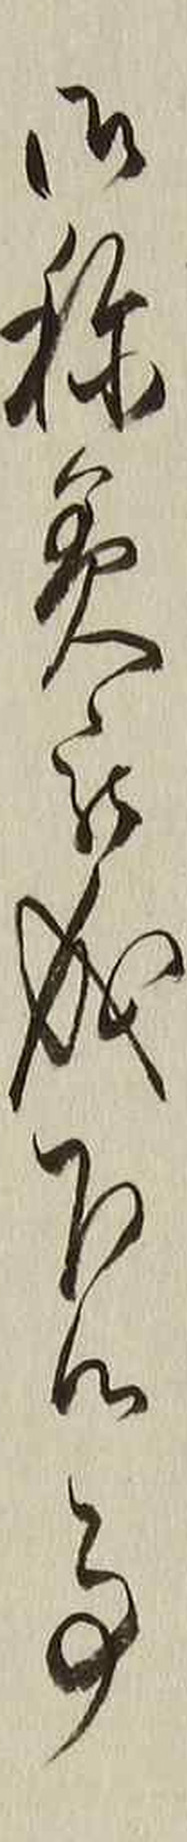御称美被成下候事
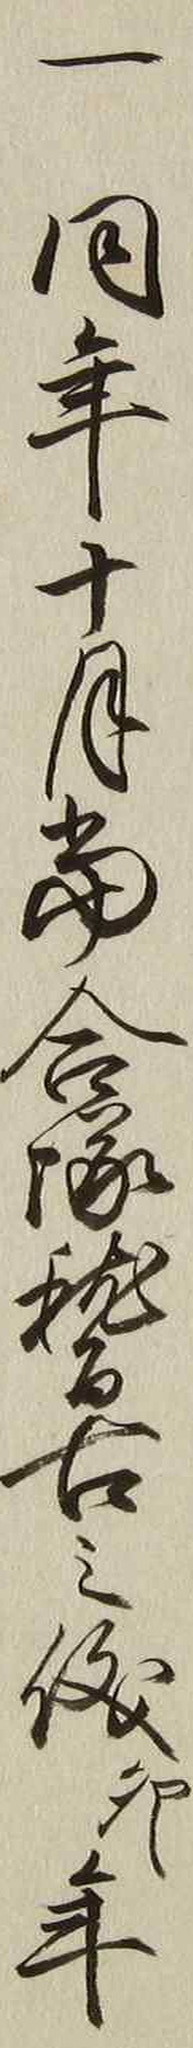一同年十月当合隊稽古之儀卯年
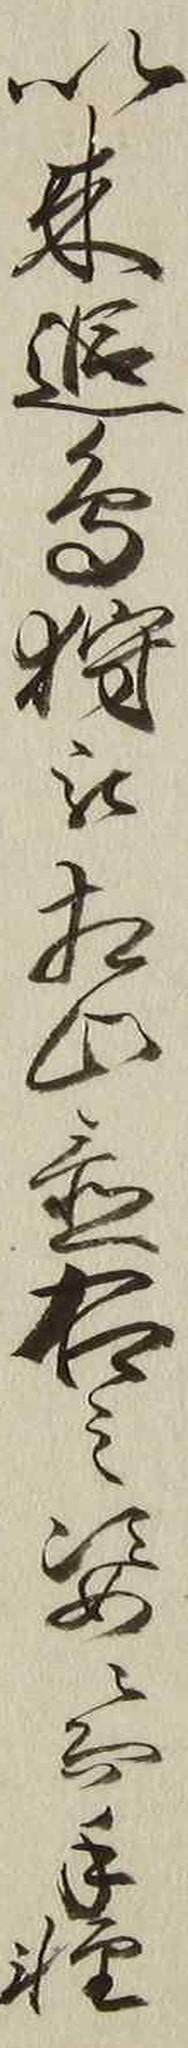以来追鳥狩被相止置右之姿ニ而手軽
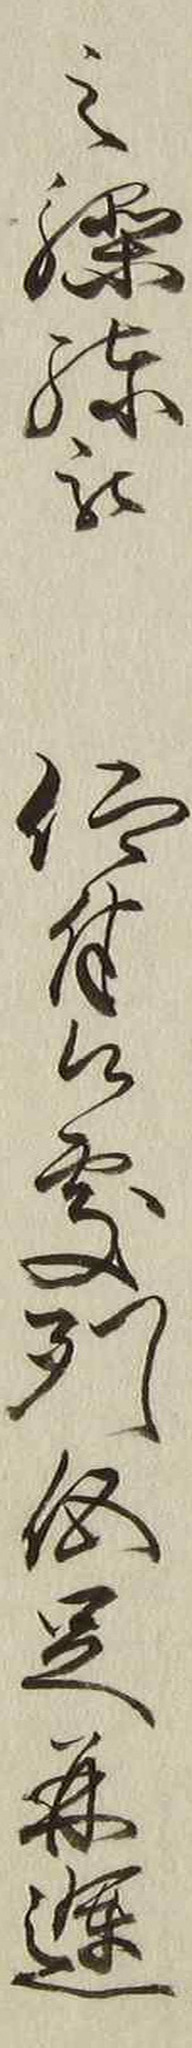之繰練被仰付候処列伍足并運
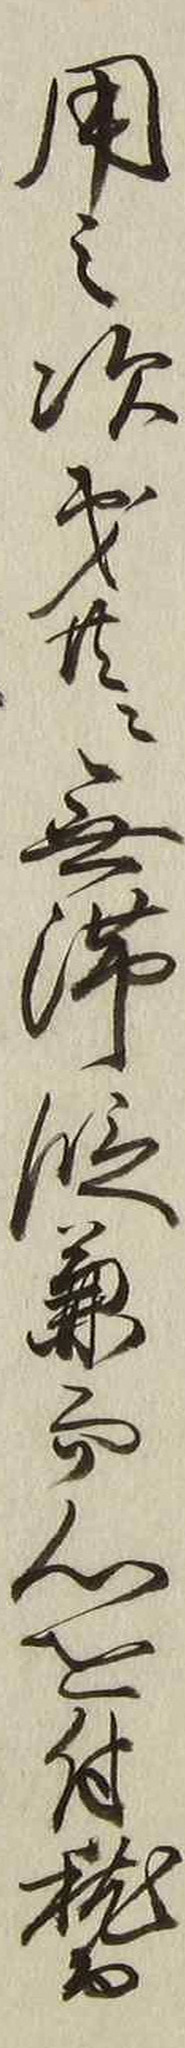用之次第共ニ無滞段兼而心を付稽
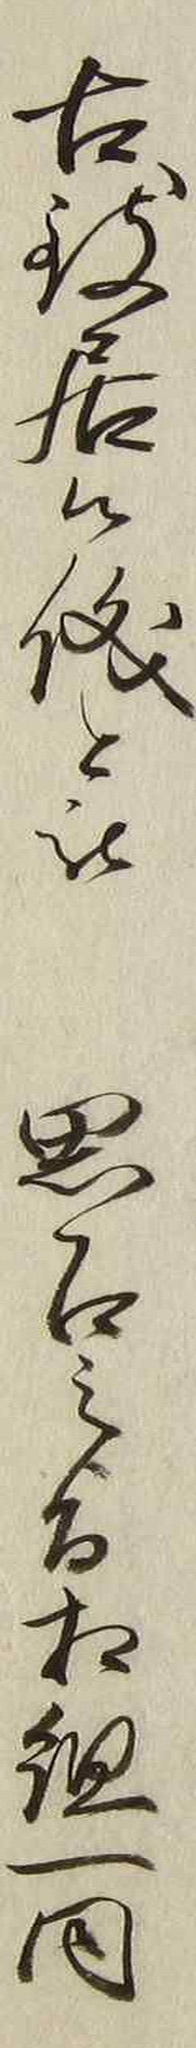古致居候儀と被思召之旨相組一同
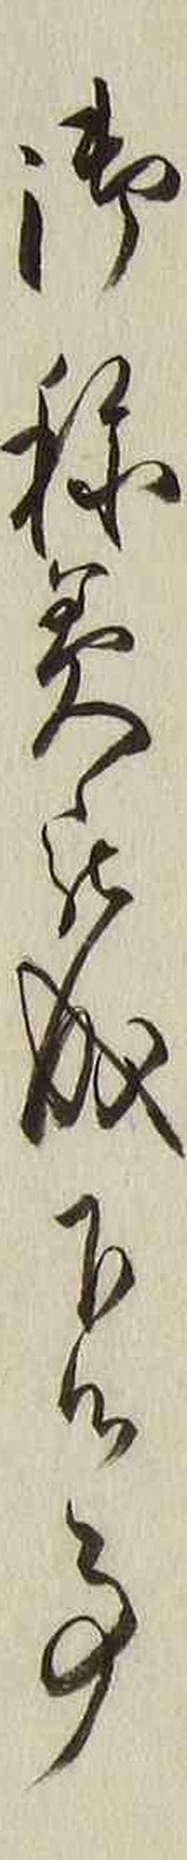御称美被成下候事
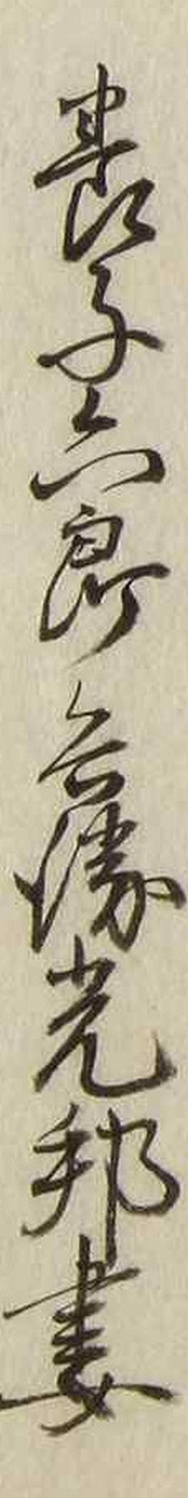養子六郎兵衛光邦妻

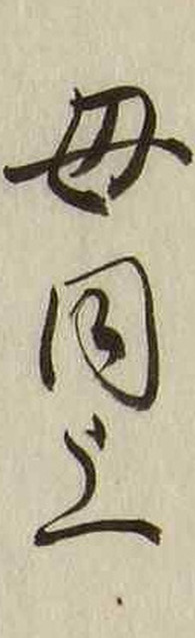母同上
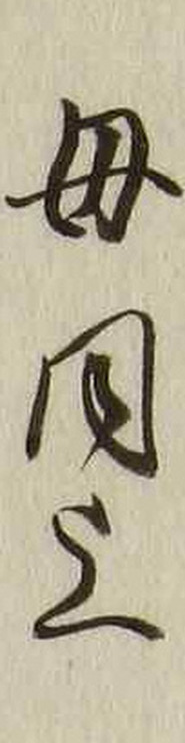母同上
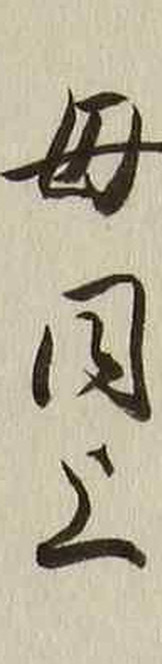母同上
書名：諸士系譜　巻之21　い之部21
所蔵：会津若松市立会津図書館
